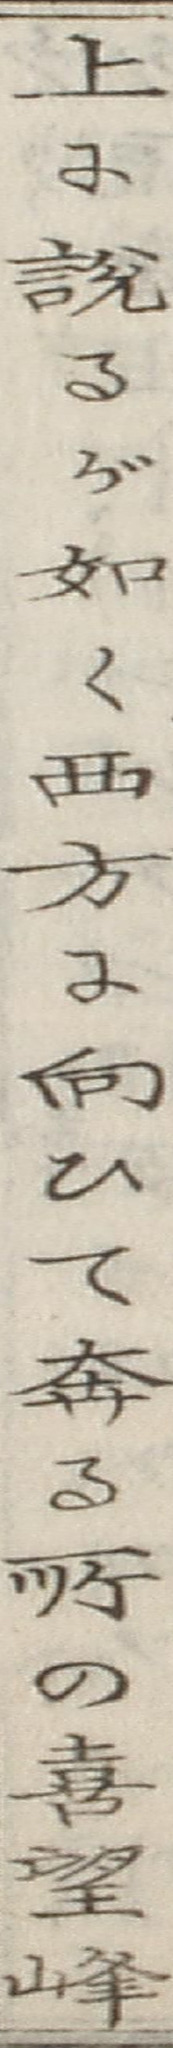上に説るが如く、西方に向ひて奔る所の喜望峰
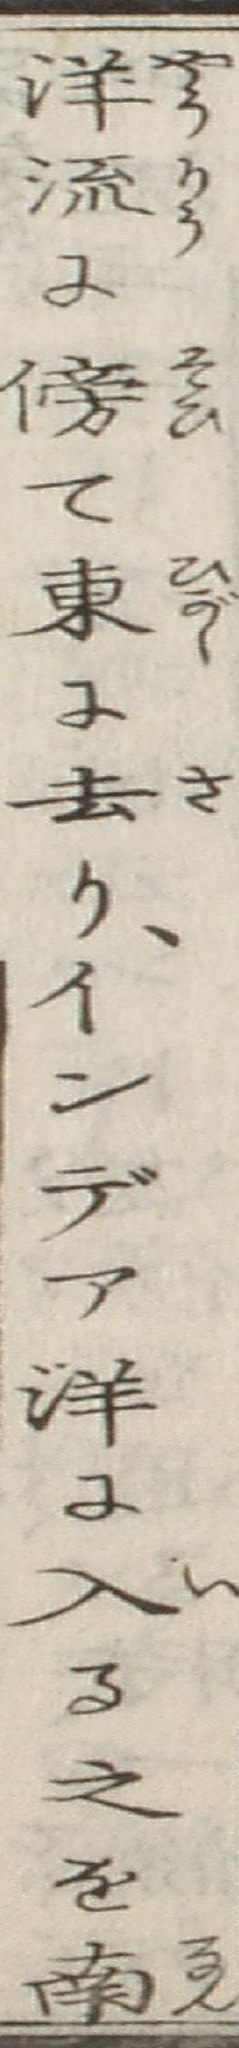洋流に傍て東に去り、インデア洋に入る之を南
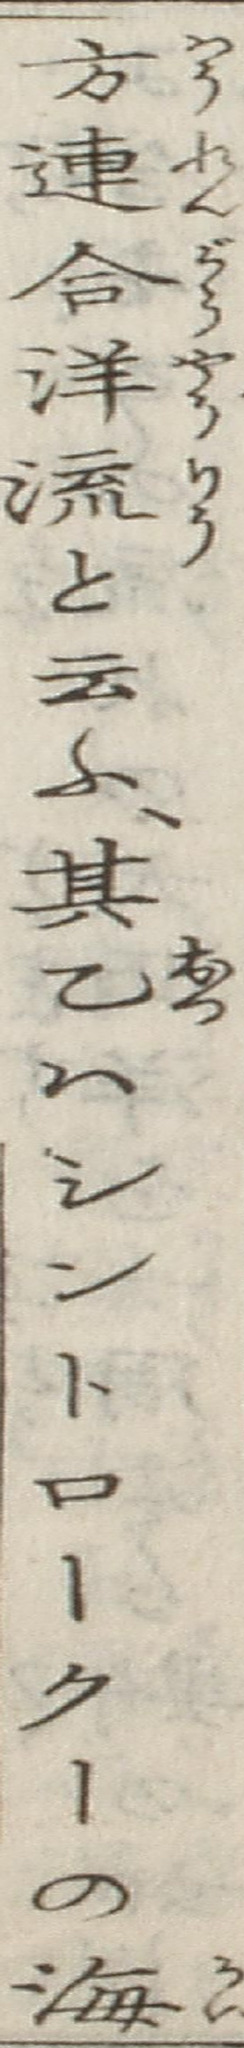方連合洋流と云ふ、其乙はシントロークーの海
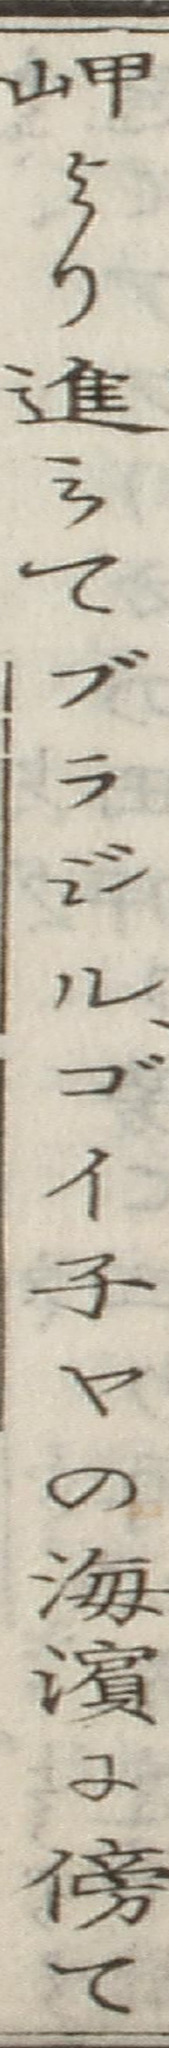岬より進みて、ブラジル、ゴイ子ヤの海浜に傍て
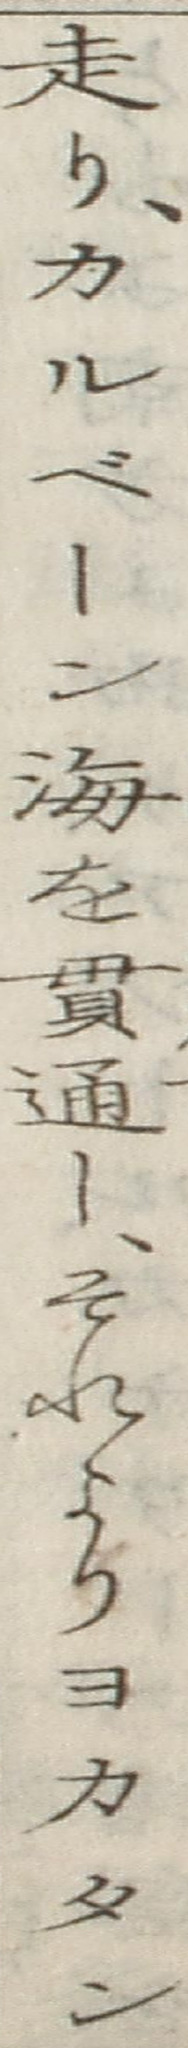走り、カルベーン海を貫通し、それよりヨカタン
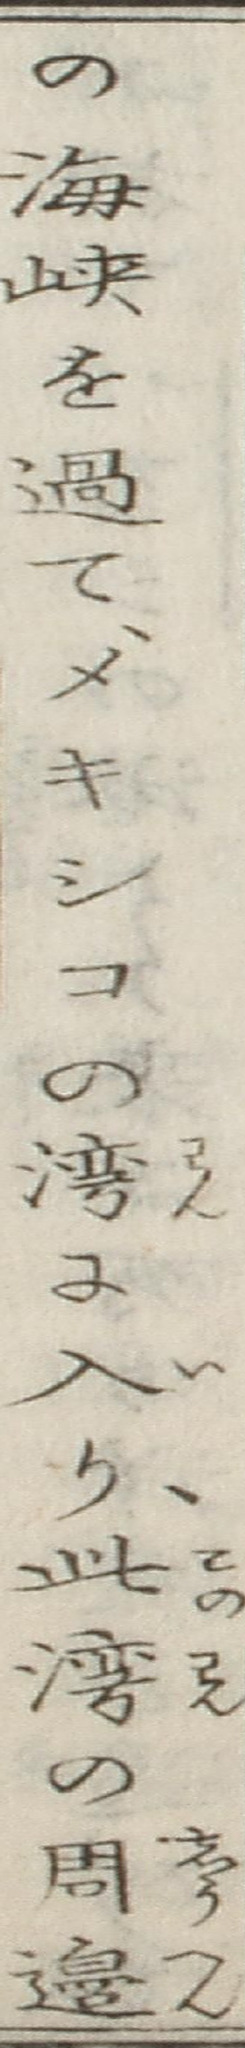の海峡を過て、メキシコの湾に入り、此湾の周辺
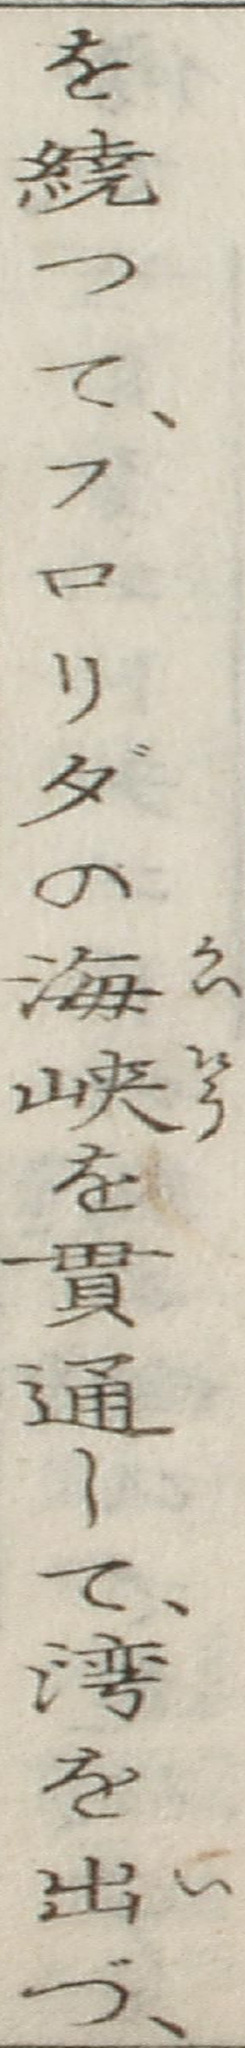を繞つて、フロリダの海峡を貫通して、湾を出づ、
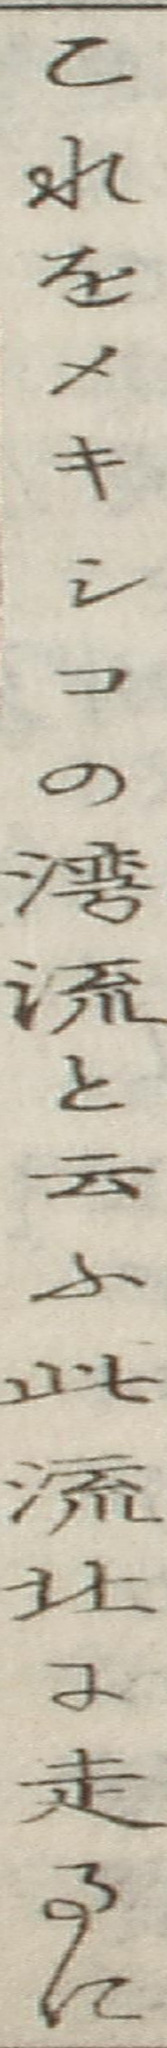これをメキヂコの湾流と云ふ、此流北に走るに

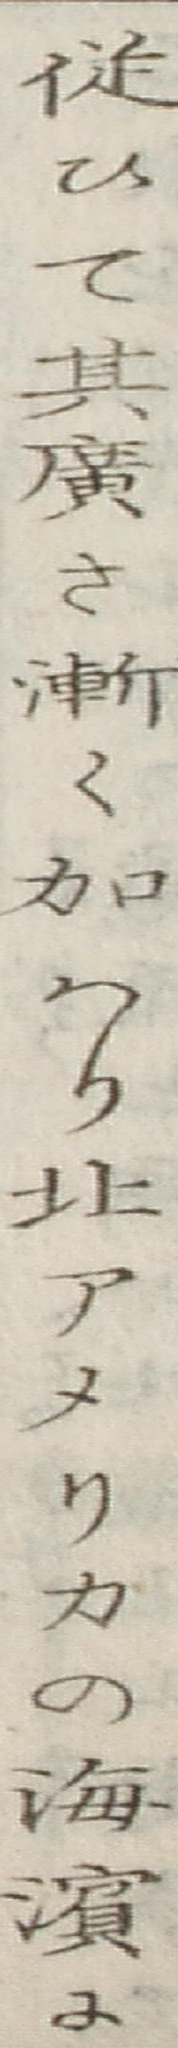従ひて其広さ漸く加はり北アメリカの海浜に
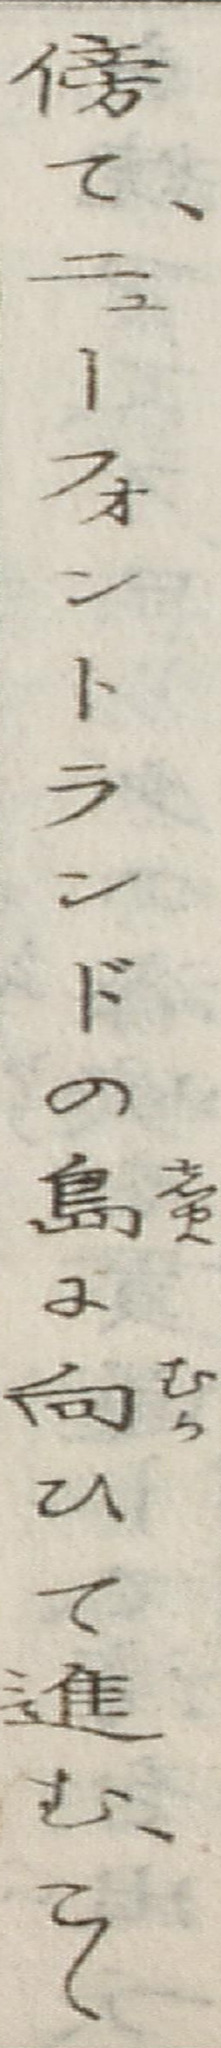傍て、ニューフォントランドの島に向ひて進む、こゝ
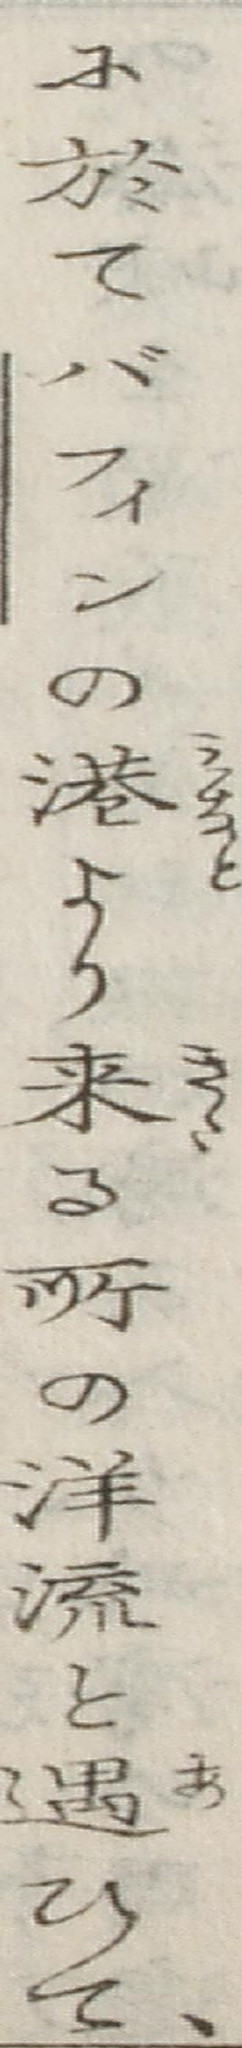に於てバフィンの港より来る所の洋流と遇ひて、
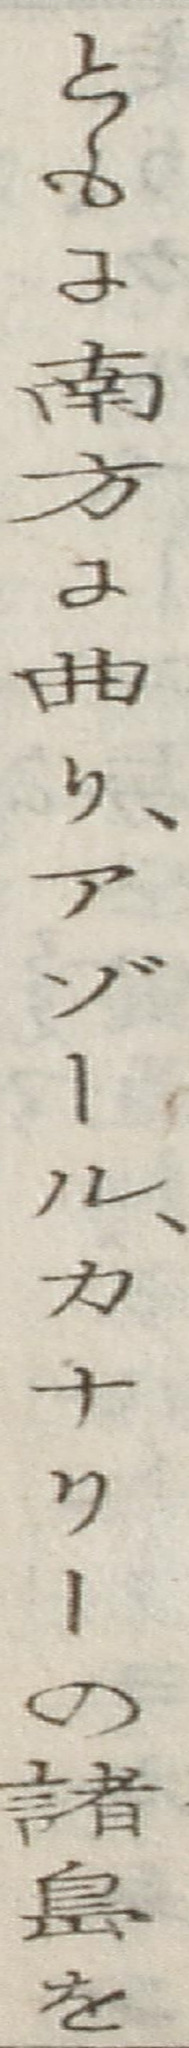ともに南方に曲り、アゾール、カナリーの諸島を
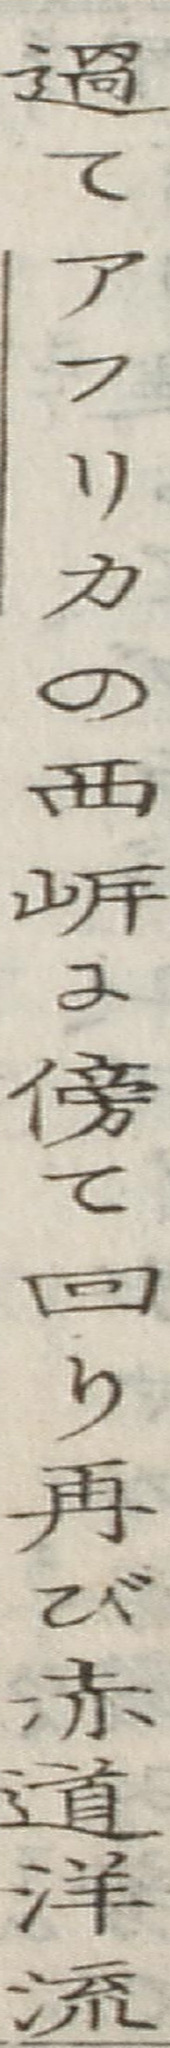過て、アフリカの西岸に傍て回り再び赤道洋流
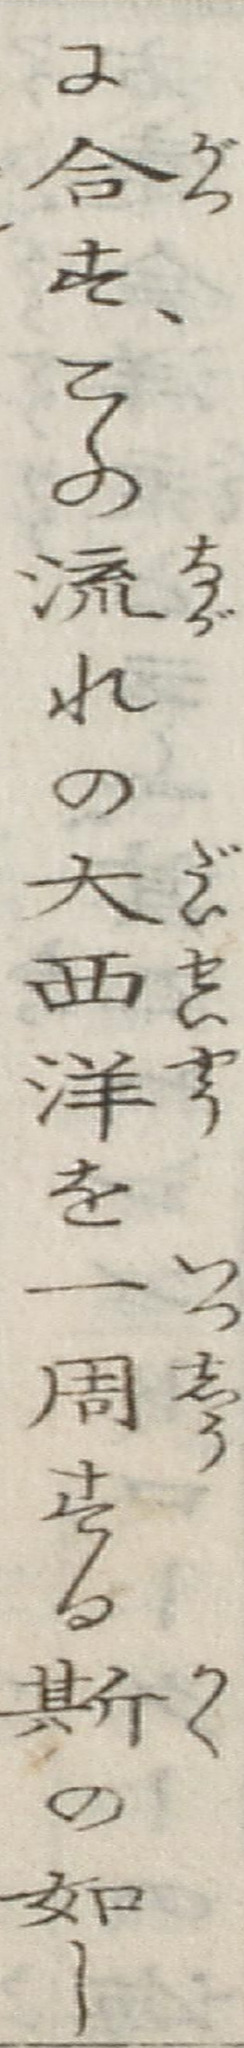に合す、こゝの流れの大西洋を一周する斯の如し
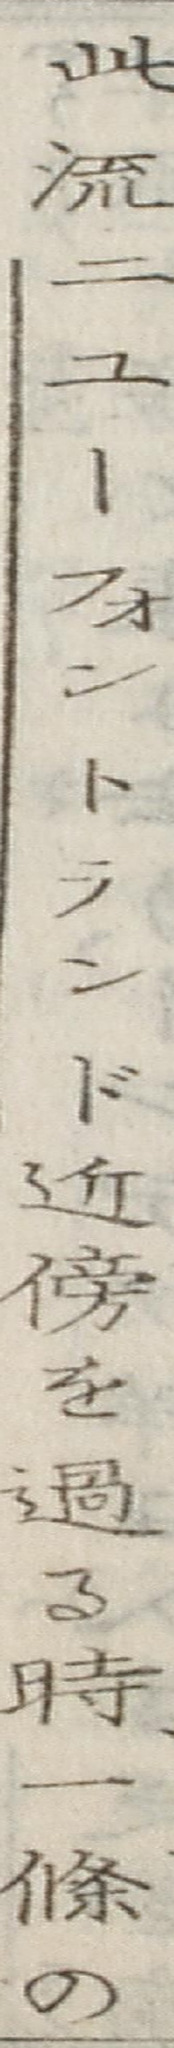此流れニューフォントランド近傍を過る時、一条の
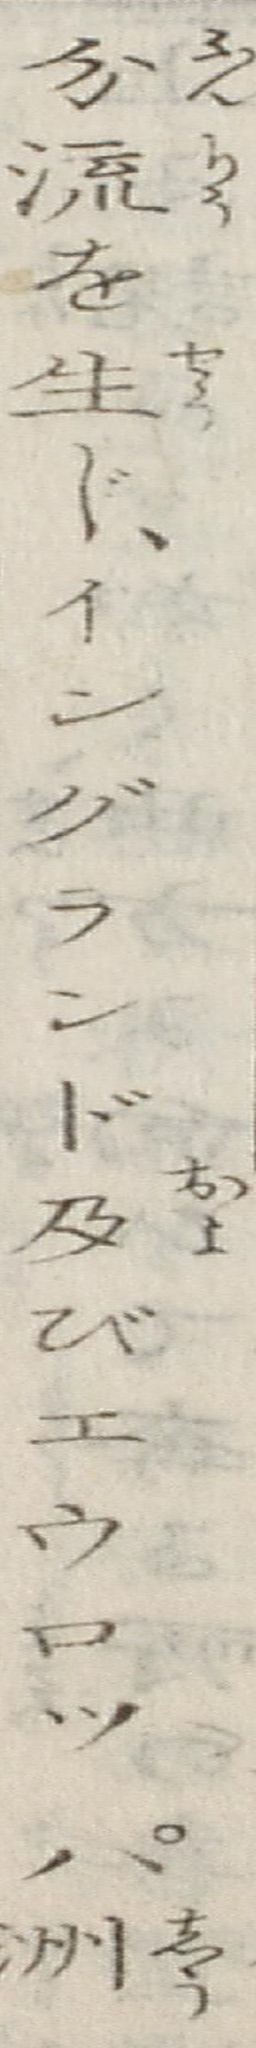分流を生じ、イングランド及びエウロツパ洲
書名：訓蒙　天然地理學　中
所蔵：東京大学地震研究所図書室 Earthquake Research Institute Library, The University of Tokyo, JAPAN
